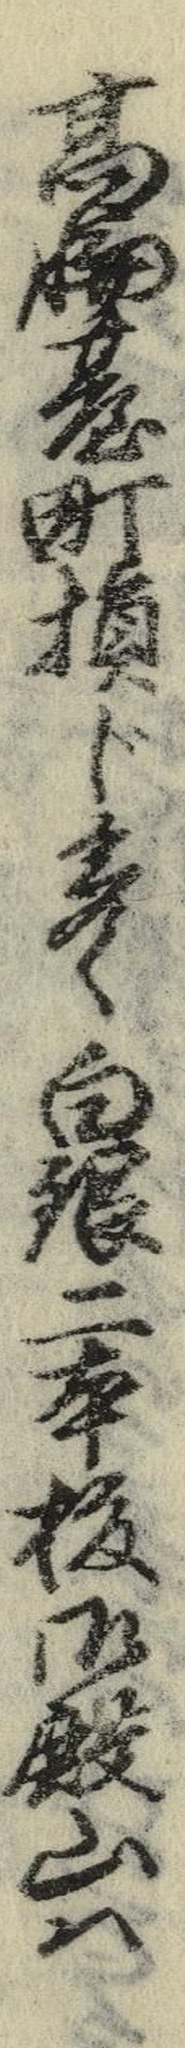高輪台町損じ多く白銀二本榎御殿山は
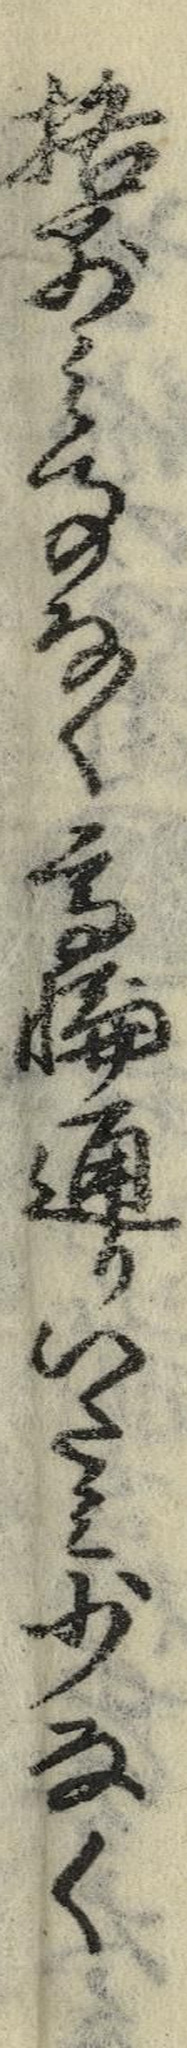格別之事なく高輪通りいたみ少なく
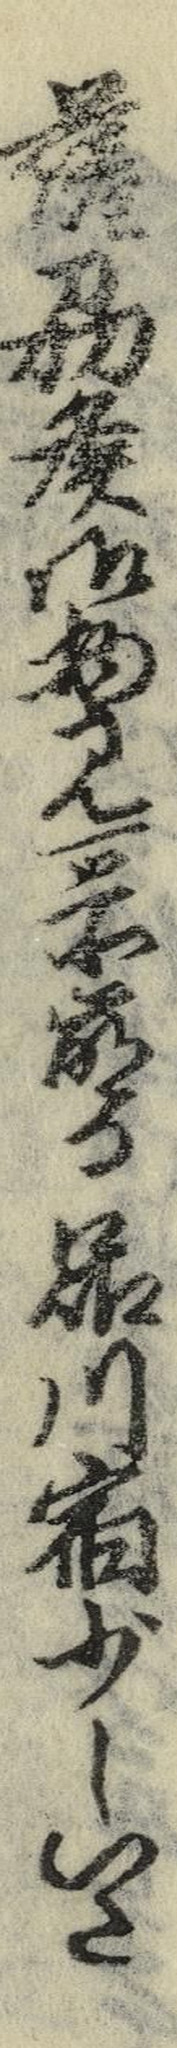薩州侯御物見一ヶ所崩る品川宿少しいた
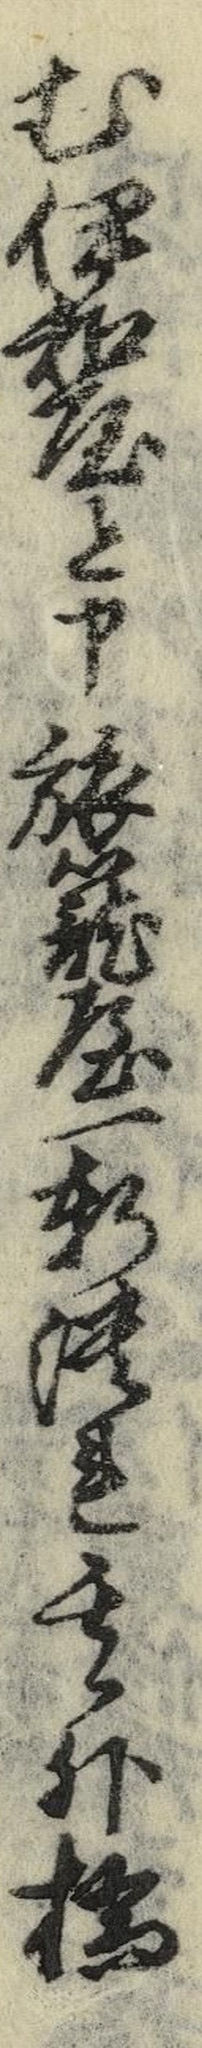む伊知屋と申旅籠屋一軒潰れ其外橋
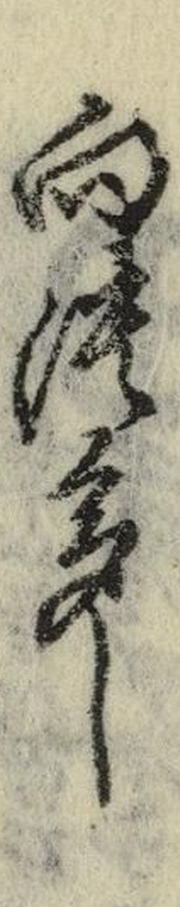向潰多し
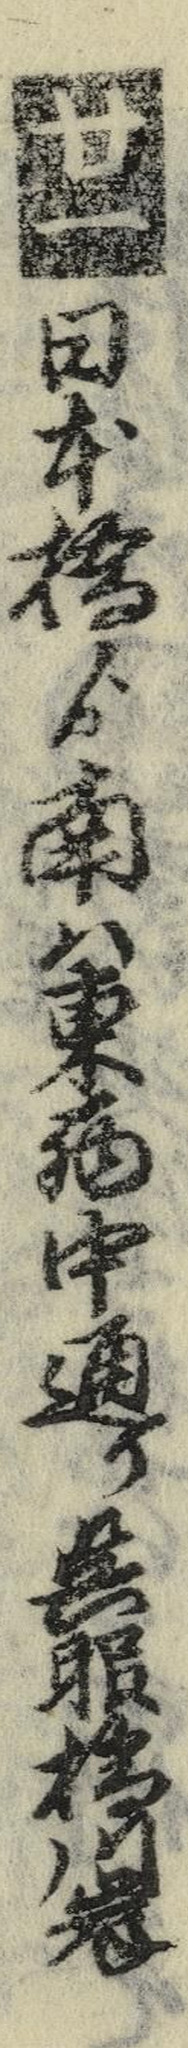廿一日本橋ゟ南は東西中通り呉服橋川岸
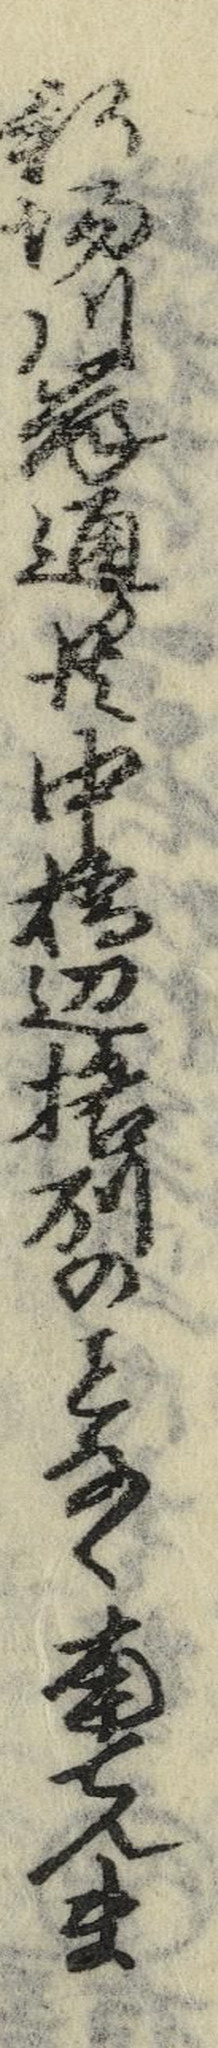新場川岸通り共中橋辺格別のことなく南てんま
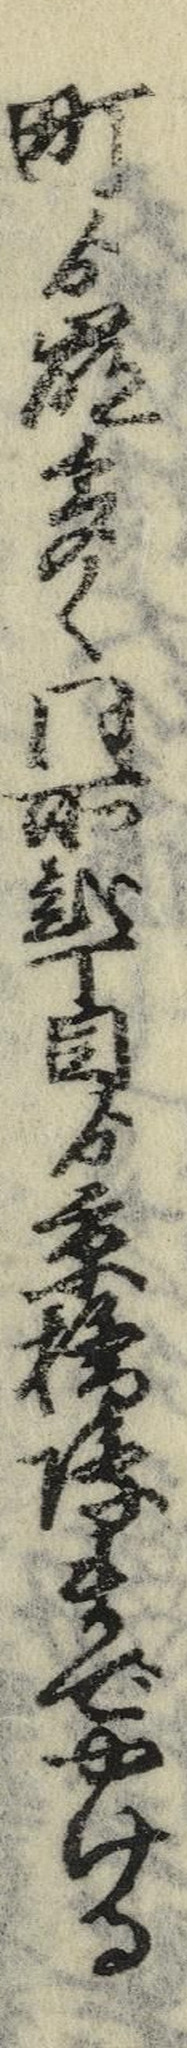町ゟ崩多く同所弐丁目ゟ京橋際までやける
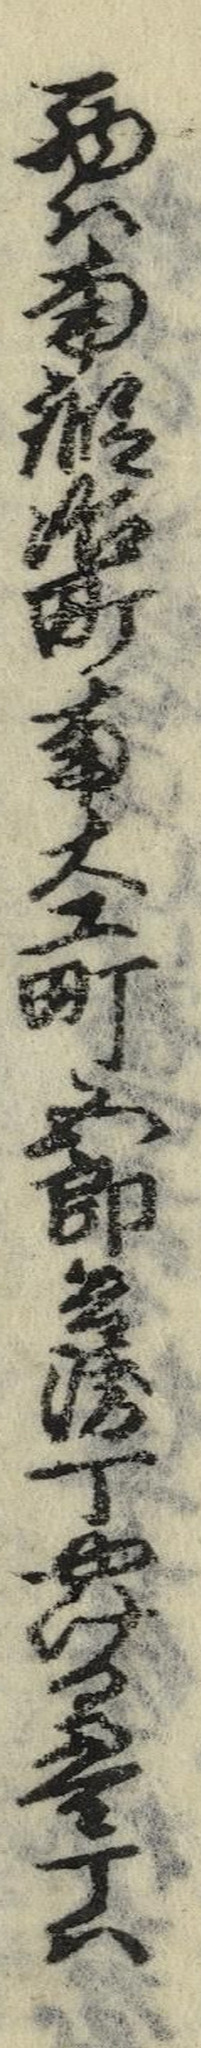西は南鍛冶町南大工町五郎兵衛丁やける畳丁は
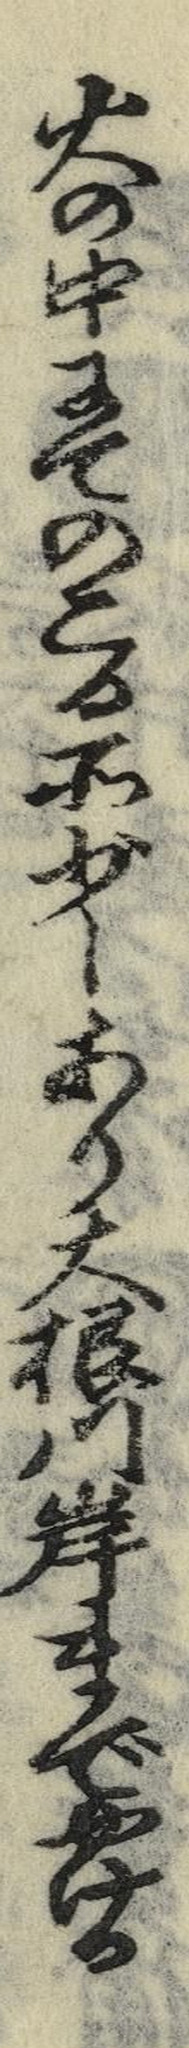火の中にてのこる所少しあり大根川岸までやける
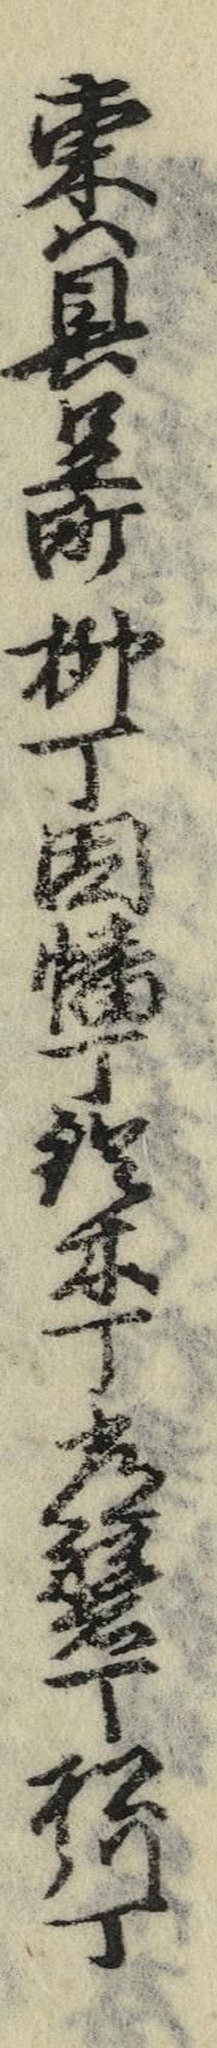東は具足町柳丁因幡丁鈴木丁常磐丁松川丁
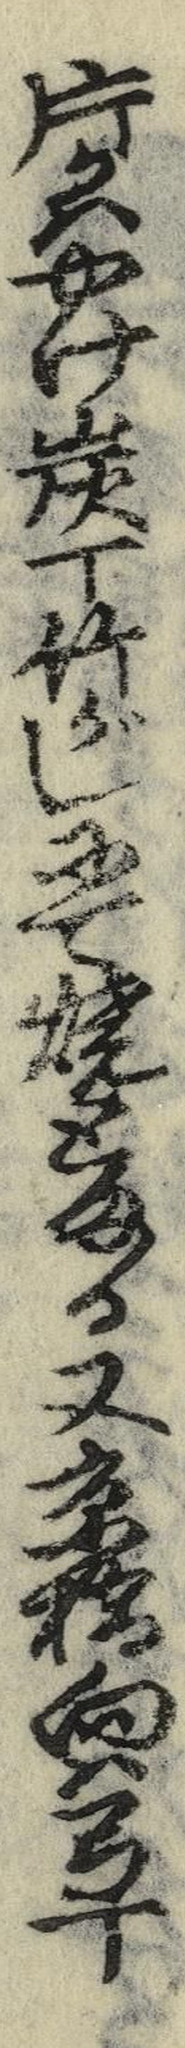片かはやけ炭丁竹がしにて焼とまる又京橋向は弓丁
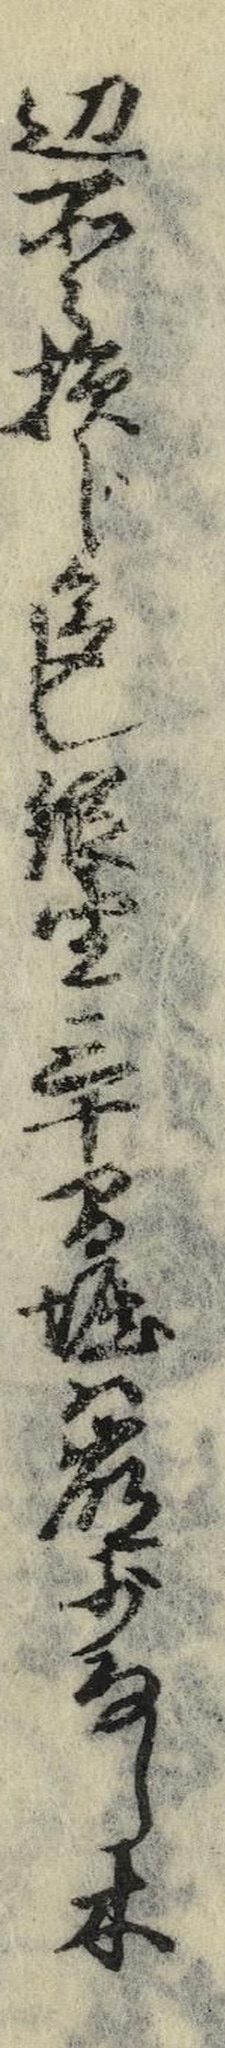辺所々損じ多し銀坐三十間堀は崩少なし木
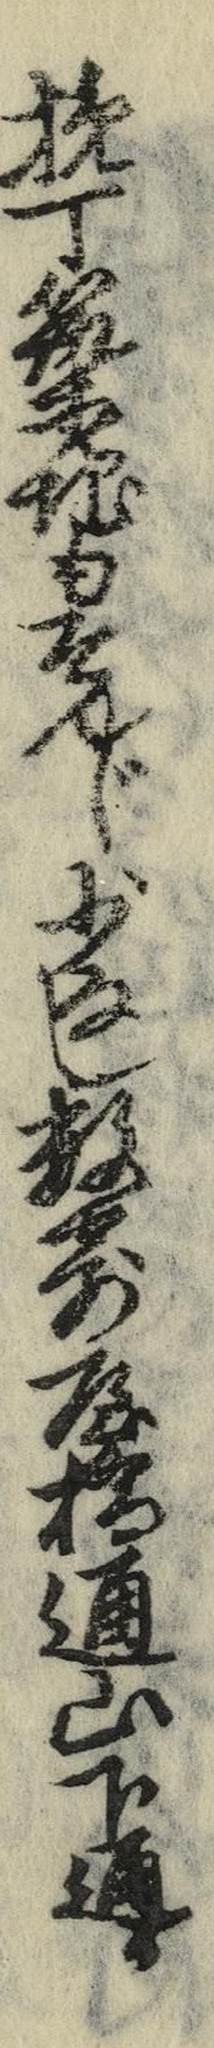挽丁築地もそんじ少なし数寄屋橋通山下通り

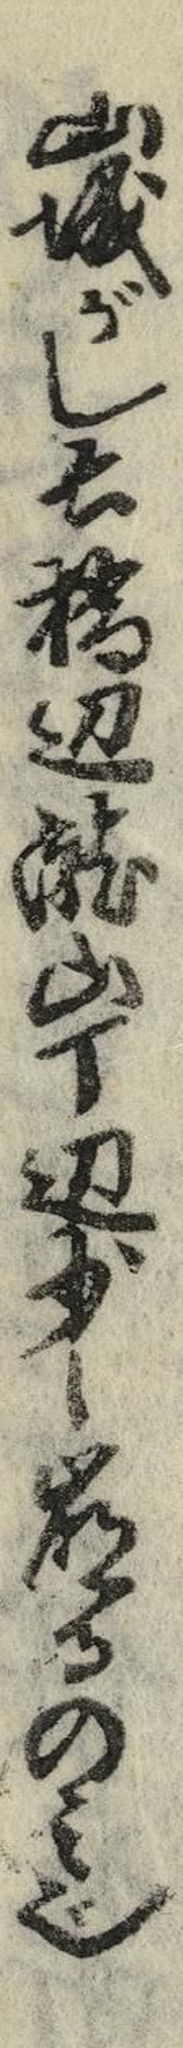山城がし土橋辺滝山丁辺少し崩るのみ也
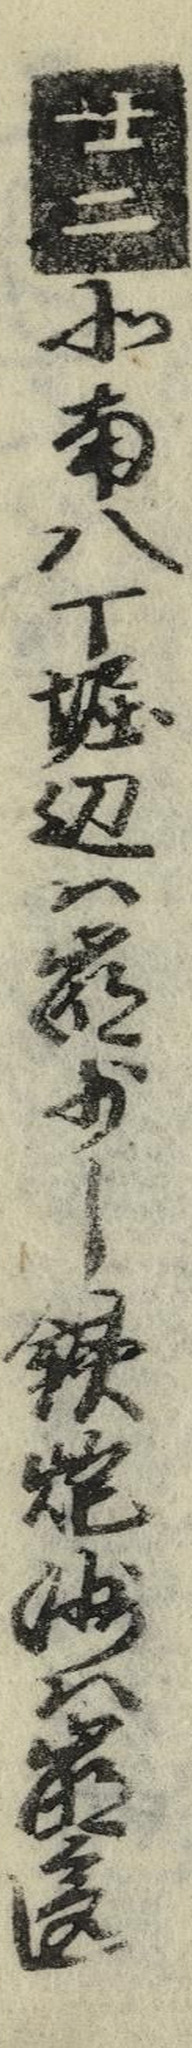廿二北南八丁堀辺は崩少し鉄砲洲は崩多し
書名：地震類焼場所明細書之写　安政二卯年十月二日夜四ツ時過　御府内御屋敷方市中共、并街道筋近郷聞書
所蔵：東京大学地震研究所図書室 Earthquake Research Institute Library, The University of Tokyo, JAPAN
